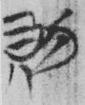則
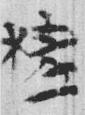{木㞷}（枉）
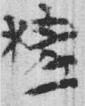○（枉）
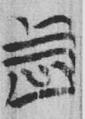者
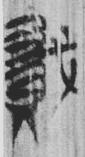敗
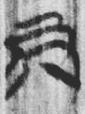而
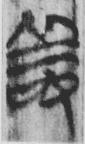敬
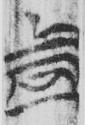者
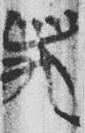萬
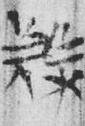殜（世）
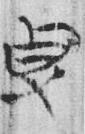史（使）
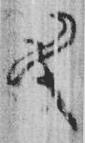民
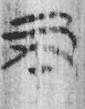不
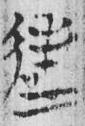逆
